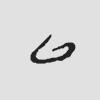㠯（以）
